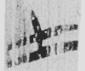士
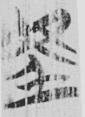○（吾）
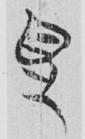見
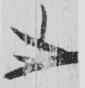之
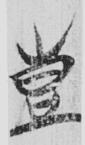壴（矣）
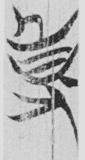事
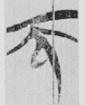而
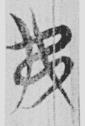弗
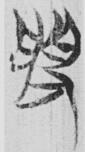受
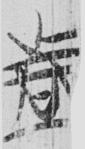者
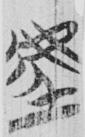○（吾）
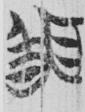○（聞）
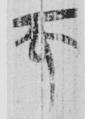而
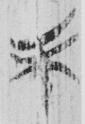未
